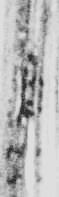情
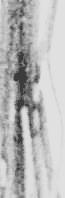或
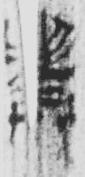興
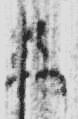之
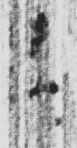也
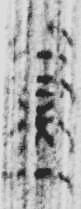堂（當）
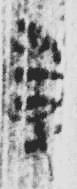事
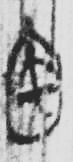因
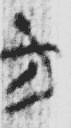方
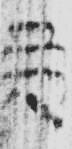而
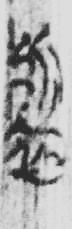○（制）
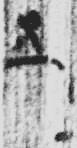之
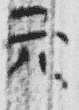亓（其）
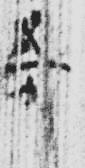先
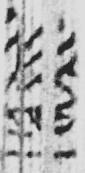後
